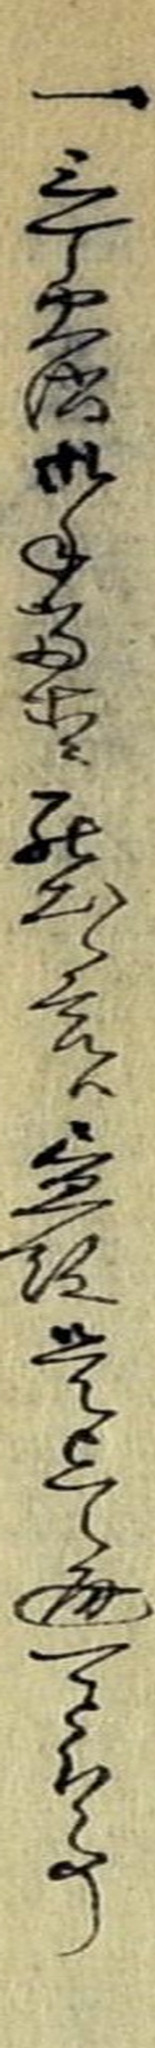一三丁火消御手当等に罷出候節は昼飯是迄之通可被下事
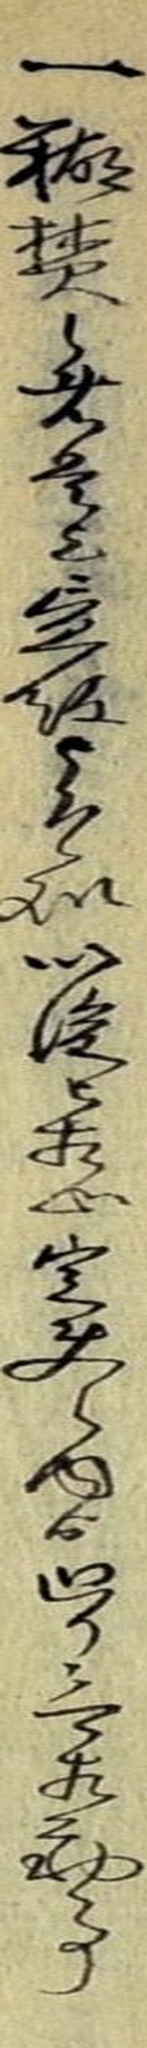一糊焚之者是迄昼飯被下候処以後被相止定夫之内ゟ廻りに可相勤事
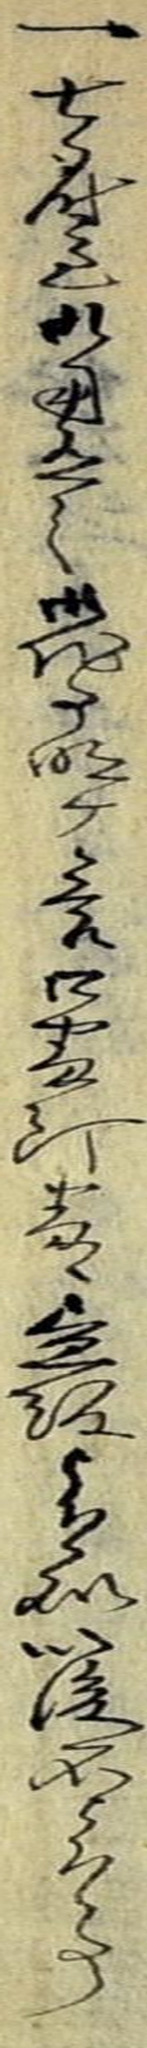一七ッ時過御用有之御作事明之節口番所番へ昼飯被下候処以後不被下事
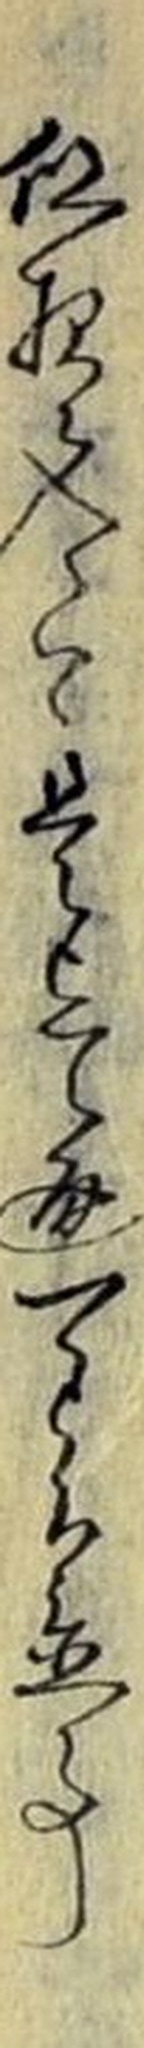但夜に入候はゝ是迄之通可被下置事
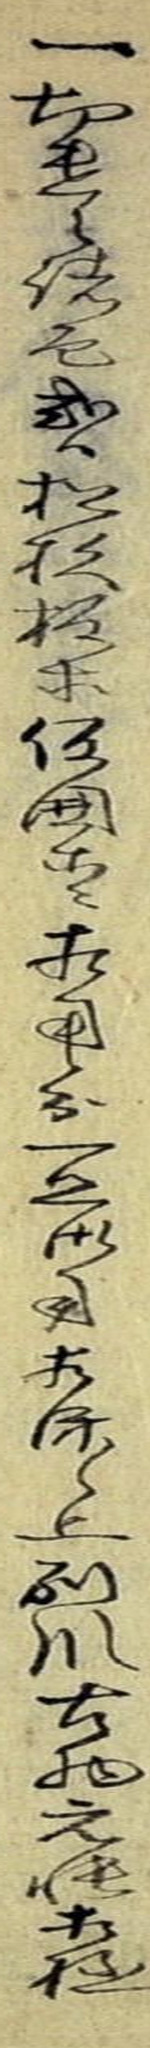一切遣之諸色或は松杉板等仮囲等に相用候分一旦御用相済候上別段古物元帳相極
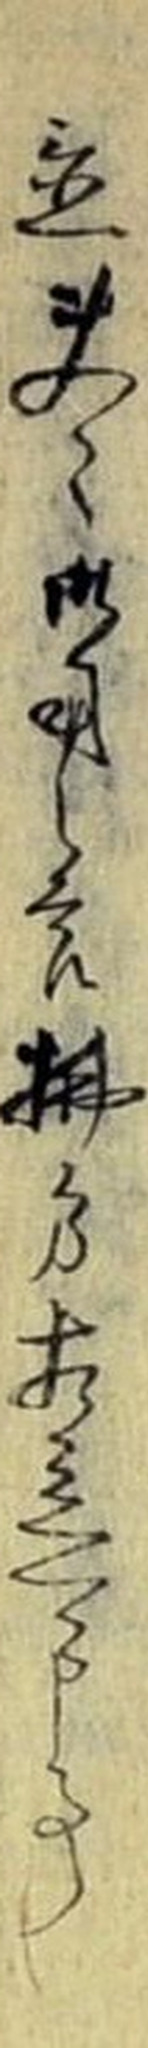置夫々御用之節払方相立可申事
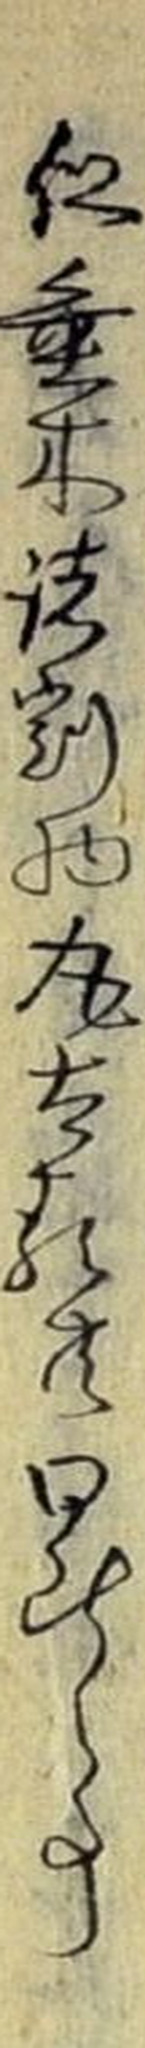但垂木諸割物丸太類共同断之事
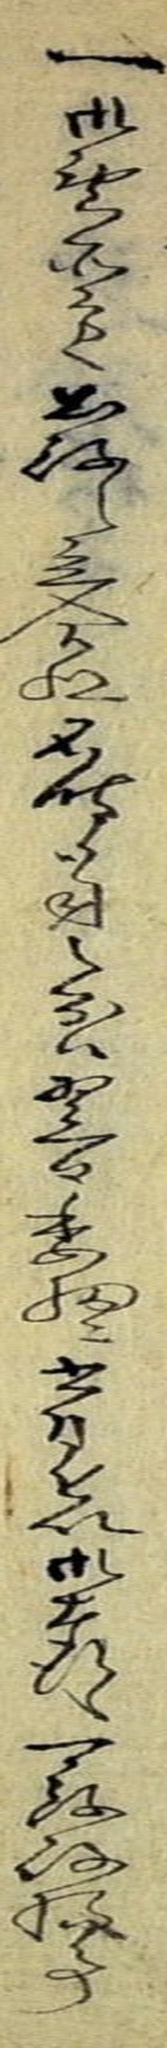一御台所方へ出役之立合組不時御用之分は翌日委細に書付を以御奉行へ可致役揚事
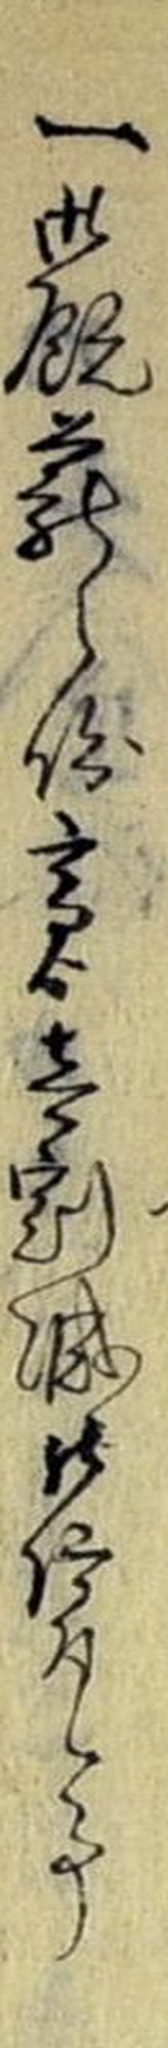一御厩薪之儀高ゟ壱割減被仰付候事
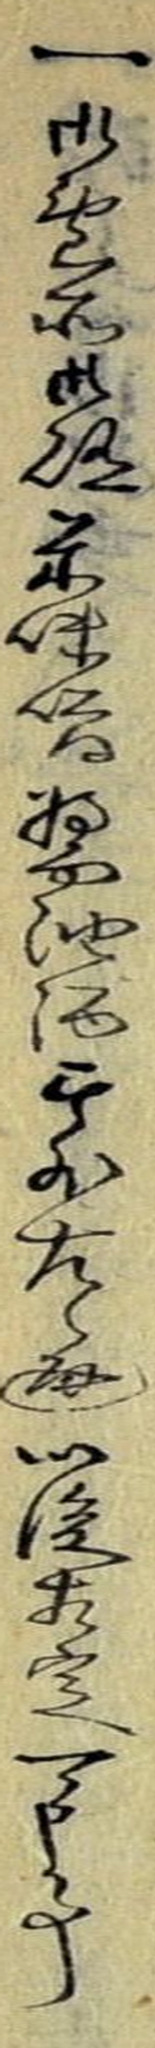一御台所御賄米味噌醤油酒其外左之通以後相定可申事
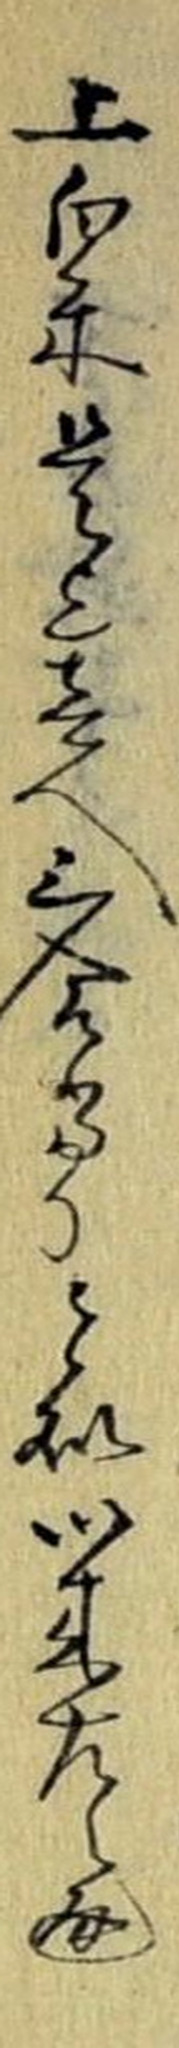上白米是迄壱人三合当りに候処以来左之通
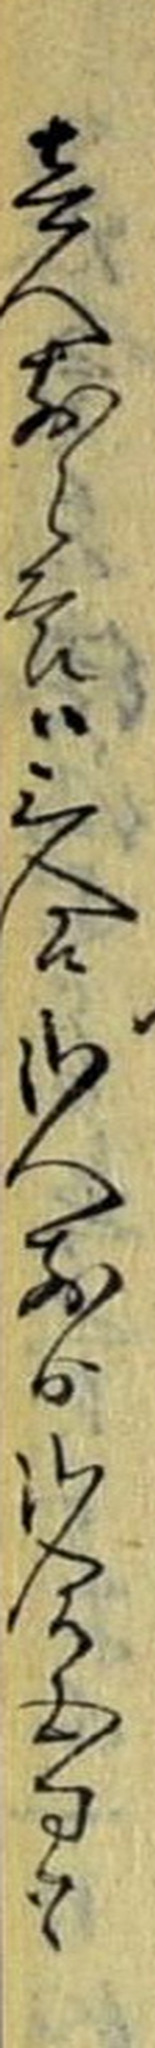壱人前之節は三合弐人前ゟ弐合五勺つヽ
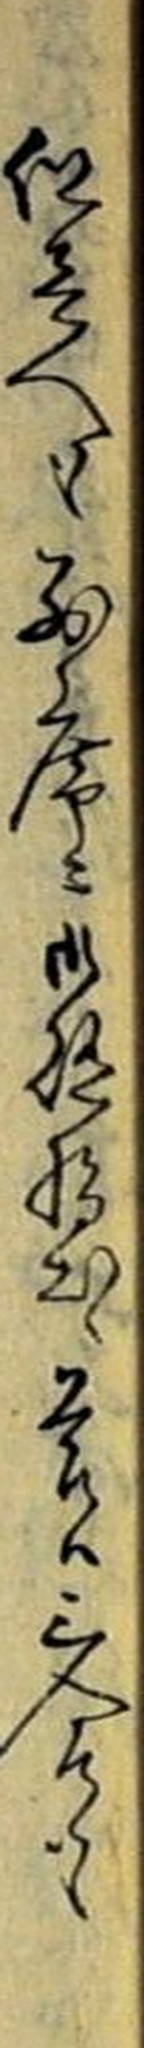但壱人つヽ別席に御賄指出候節は三合つヽ
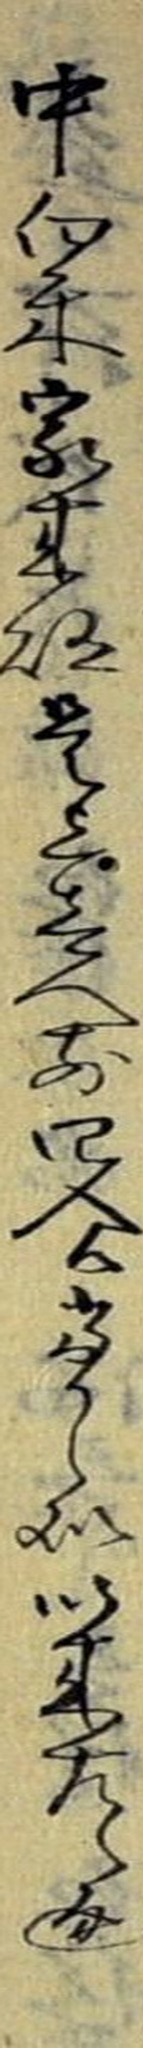中白米家来賄是迄壱人前四合当り之処以来左之通
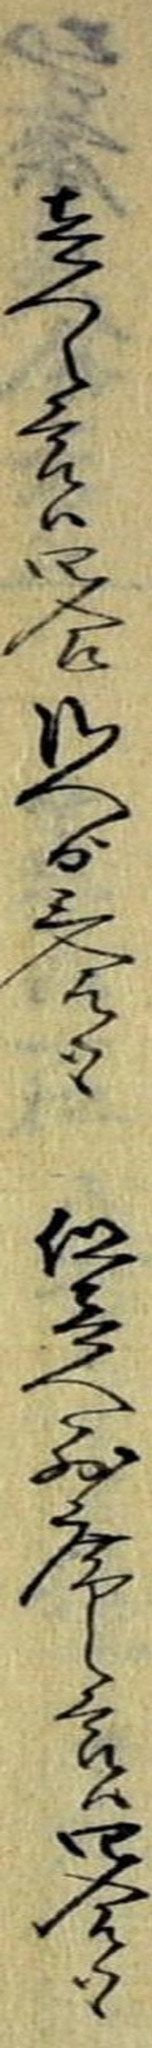壱人之節は四合弐人ゟ三合つヽ但壱人別席之節は四合つヽ
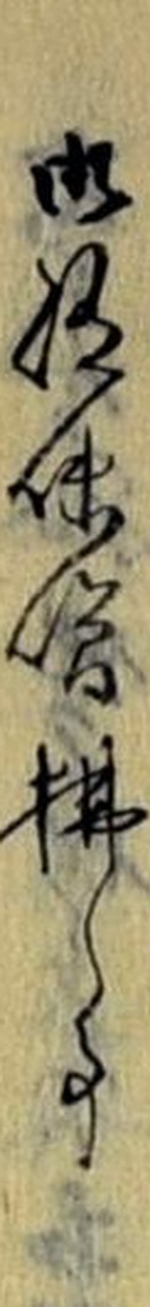御賄味噌払之事
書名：命令之部 四
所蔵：福井県文書館 Fukui Prefectural Archives
